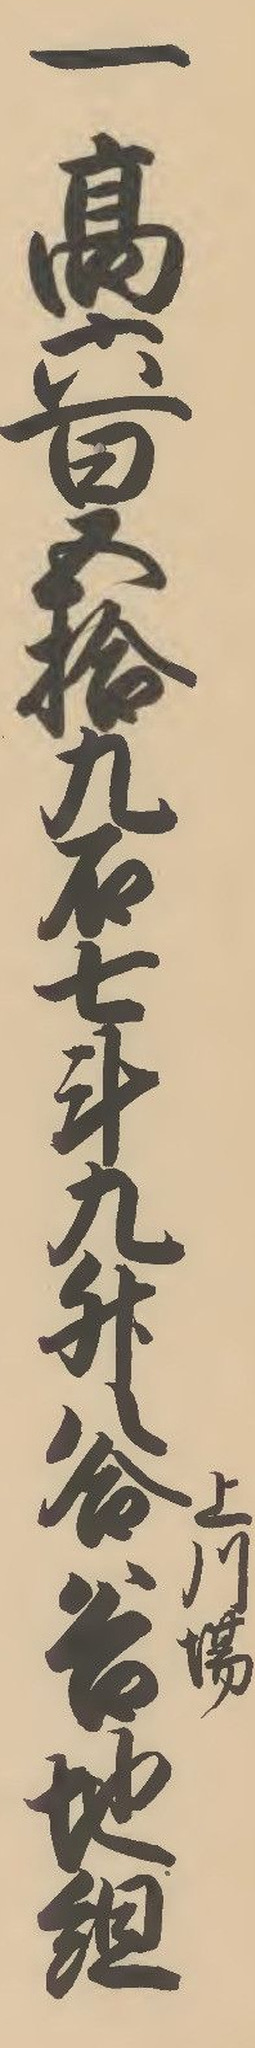一髙六百五拾九石七斗九升八合谷地組
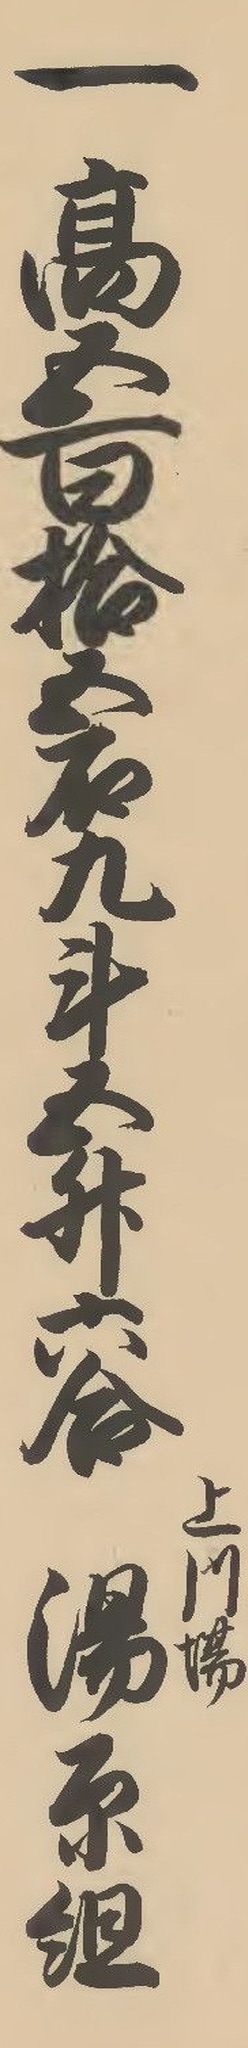一髙五百拾五石九斗五升六合湯原組
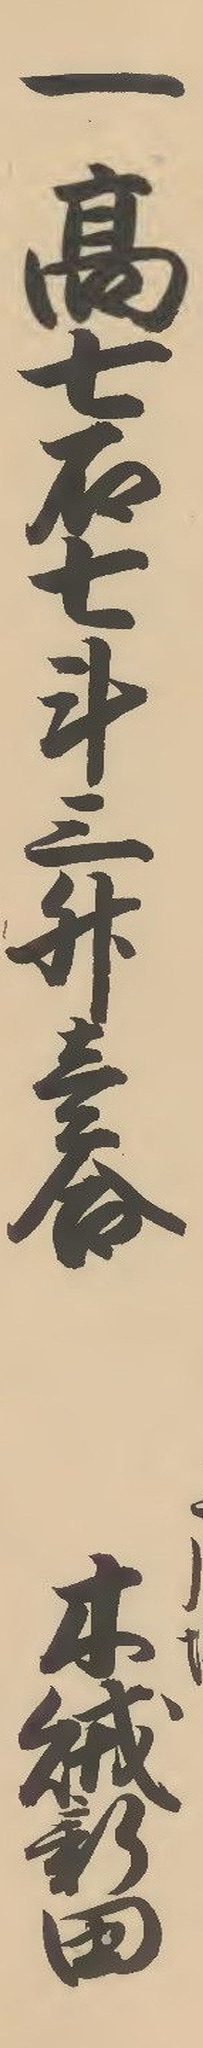一髙七石七斗三升壱合木賊新田
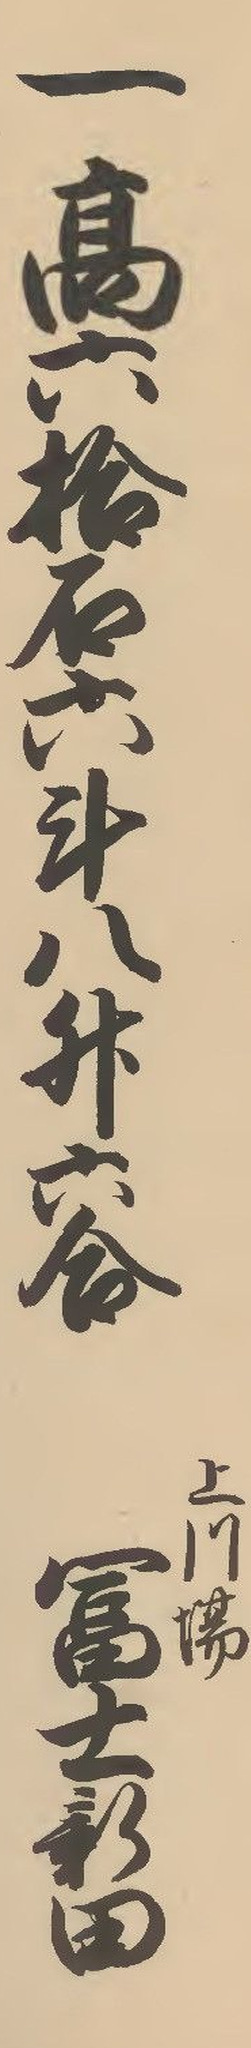一髙六拾石六斗八升六合富士新田
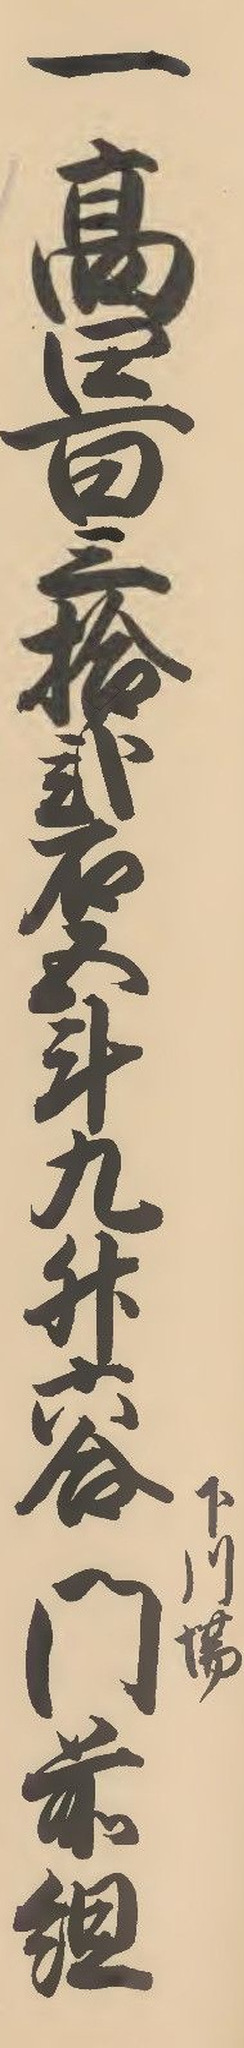一髙四百三拾弐石五斗九升六合門前組
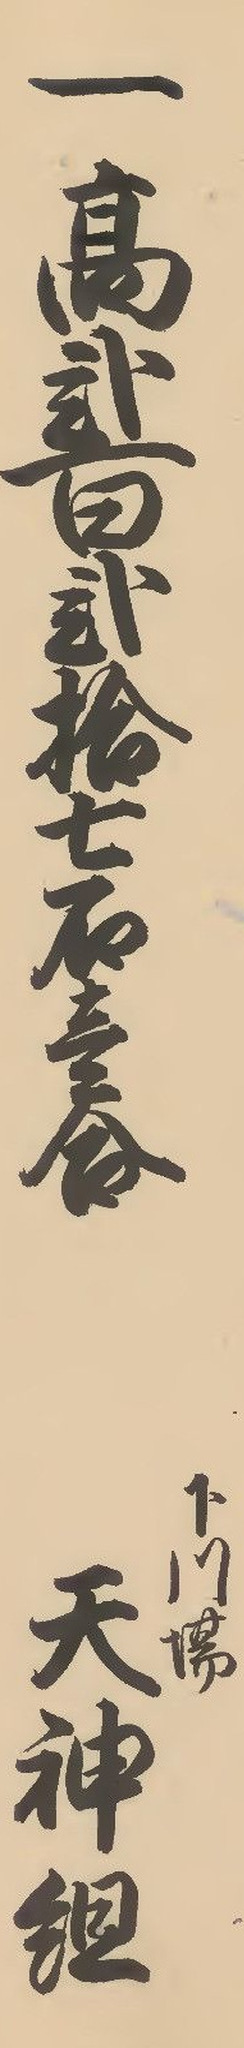一髙弐百弐拾七石壱合天神組
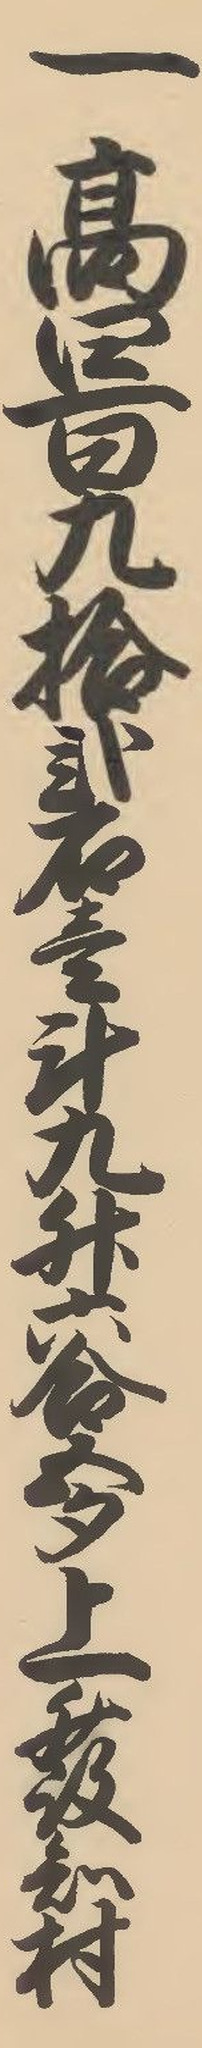一髙四百九拾弐石壱斗九升六合五夕上發知村
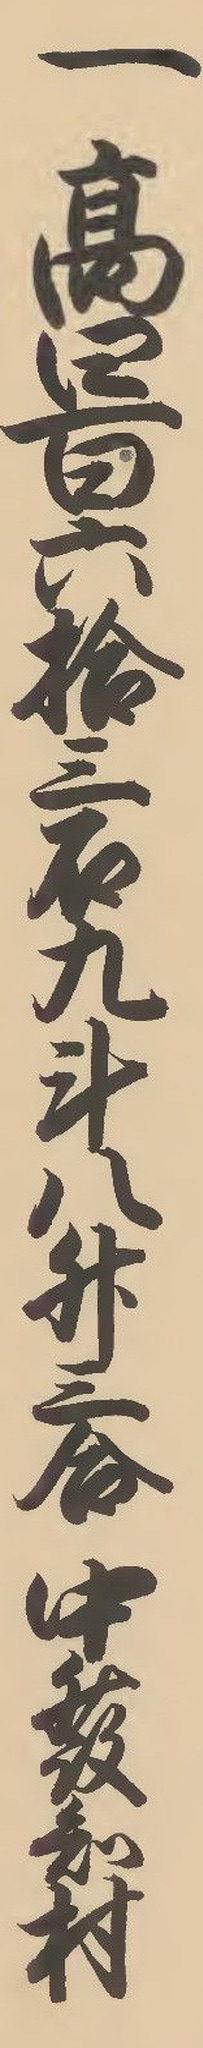一髙四百六拾三石九斗八升三合中發知村

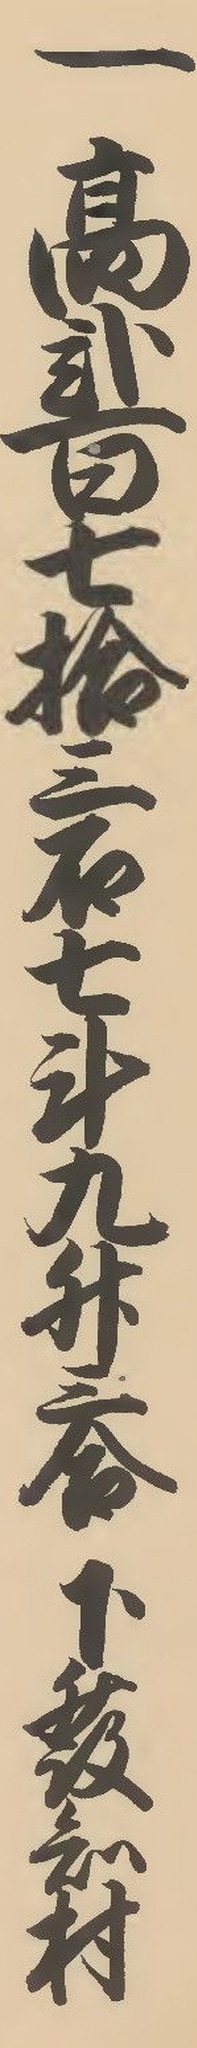一髙弐百七拾三石七斗九升三合下發知村
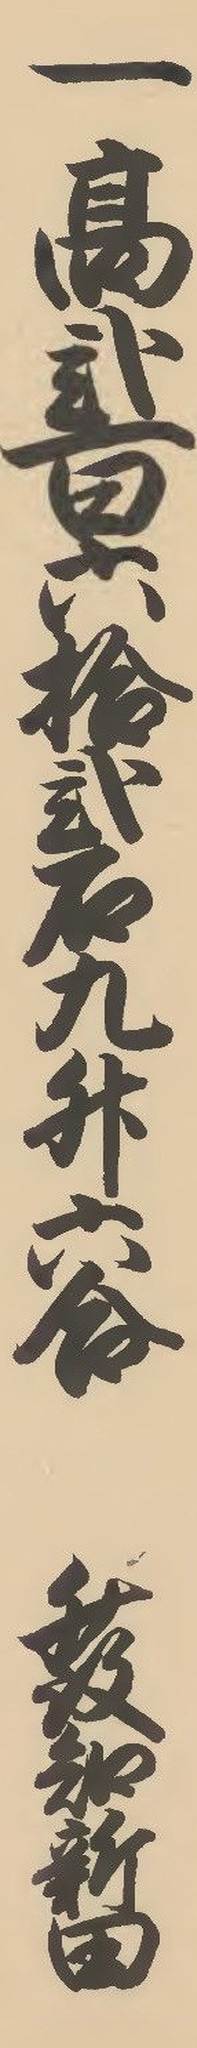一髙弐百六拾弐石九升六合發知新田
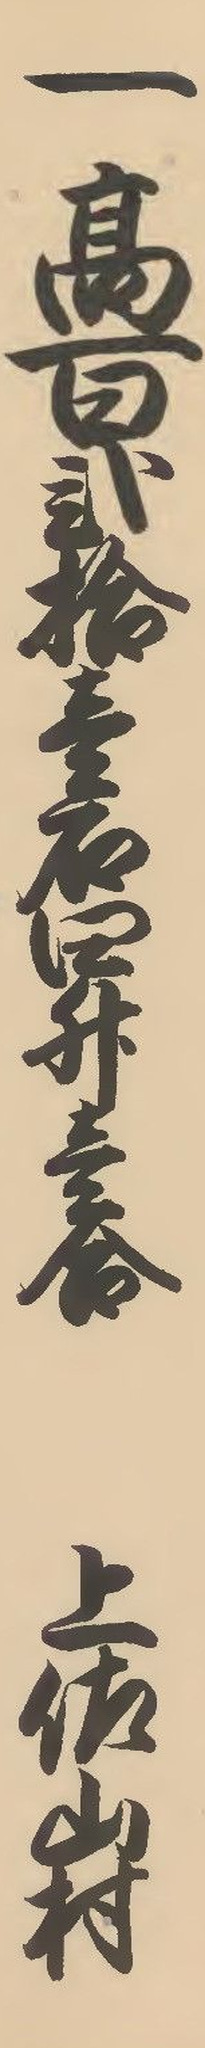一髙百弐拾壱石四升壱合上佐山村
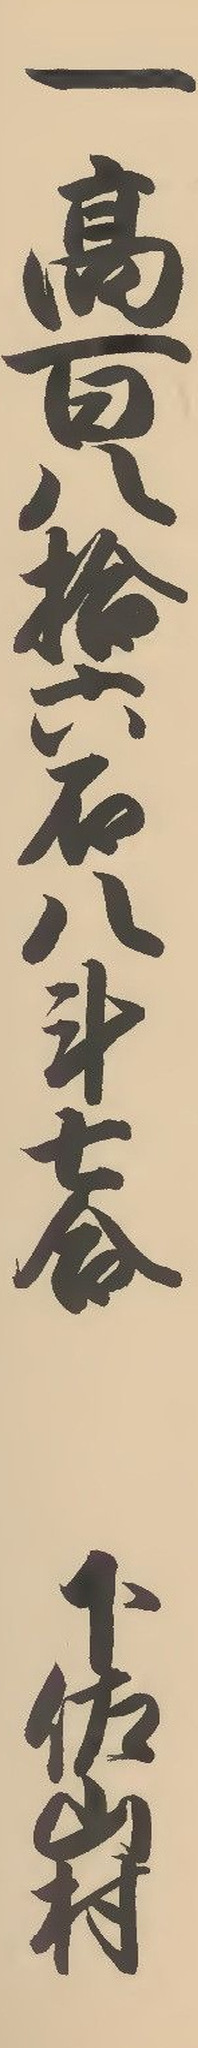一髙百八拾六石八斗七合下佐山村
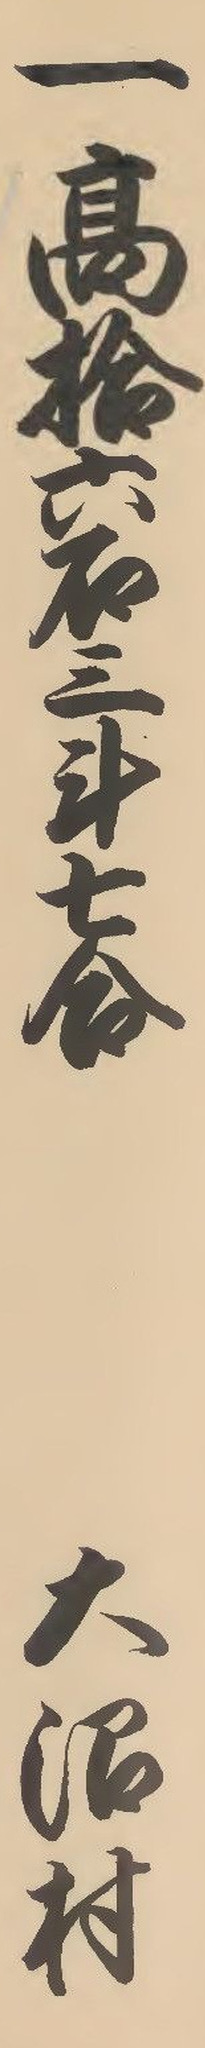一髙拾六石三斗七合大沼村
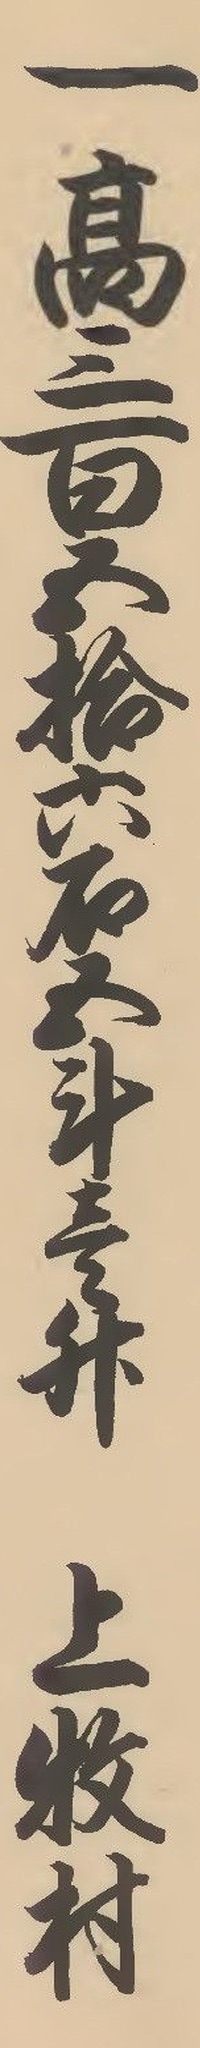一髙三百五拾六石五斗壱升上牧村
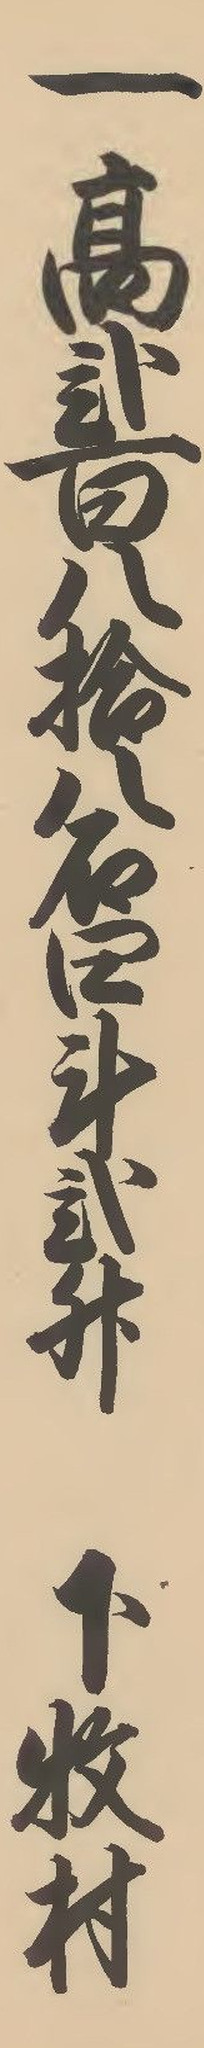一髙弐百八拾八石四斗弐升下牧村
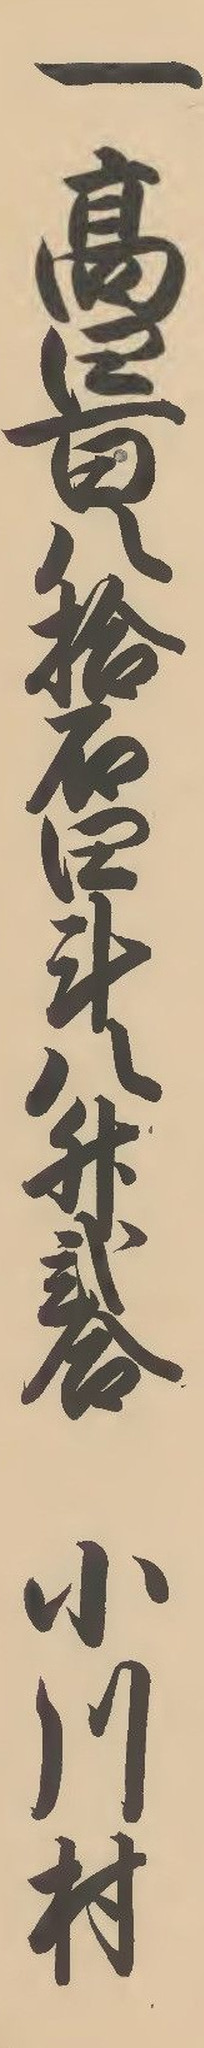一髙四百八拾石四斗八升弐合小川村
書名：上野国郷帳
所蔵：国立公文書館 National Archives of Japan
